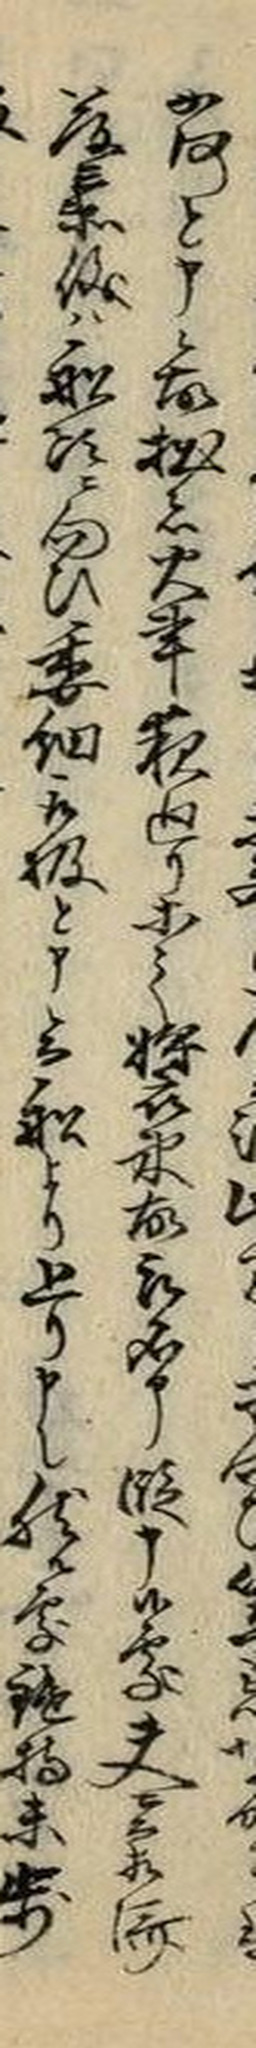藤兵衛儀は船頭に向ひ委細取扱と申候て船より上り申候然ル処鑓持未歩
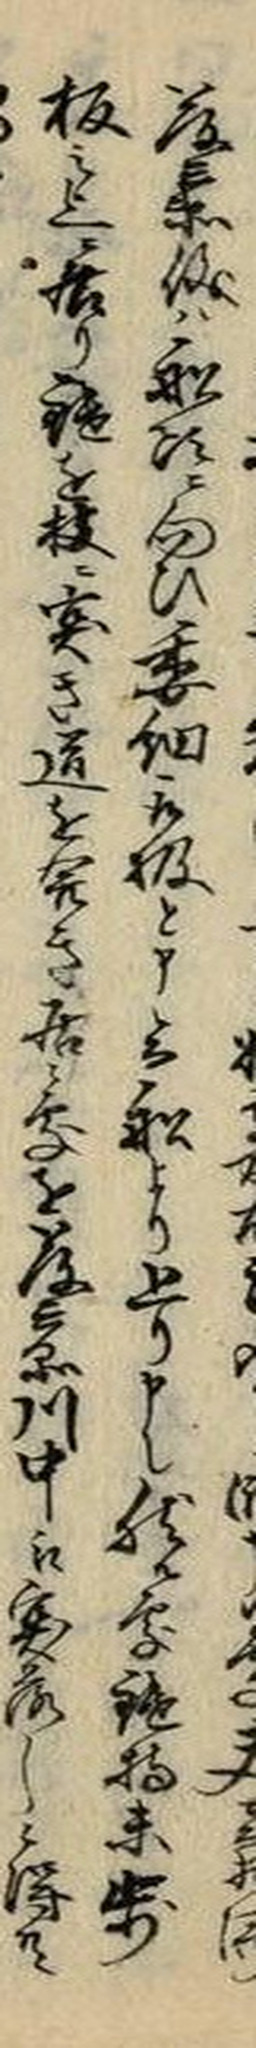板之上に居り鑓を杖に突き道を開き居候処を藤兵衛川中え突落し候得共
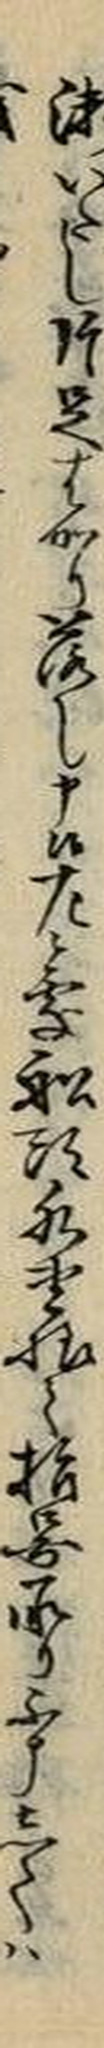漸いたし片足はかり落し申候左候処船頭水野様之指図承り不申しては
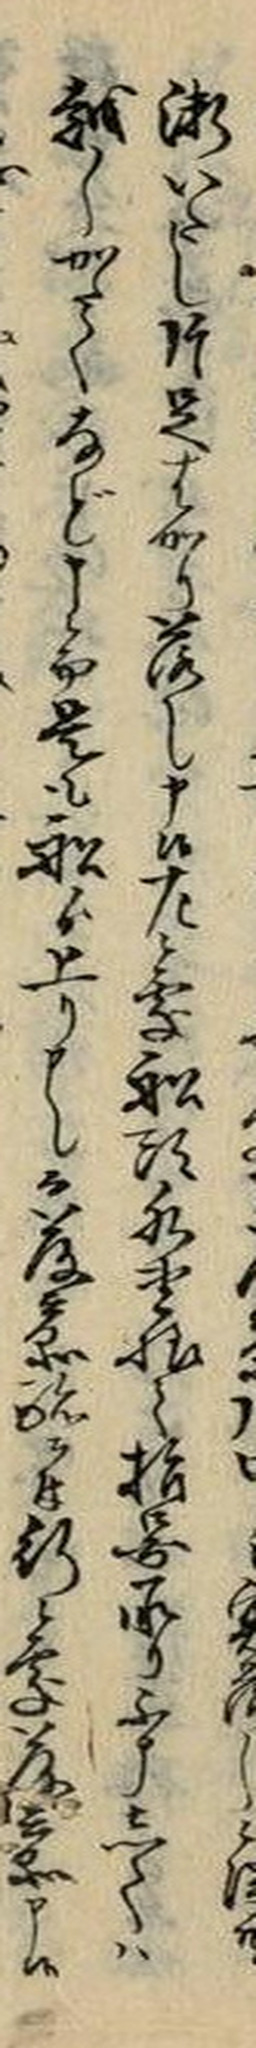越しかたくなど申候て是も船ゟ上り申候て藤兵衛跡に付行候処藤兵衛申候
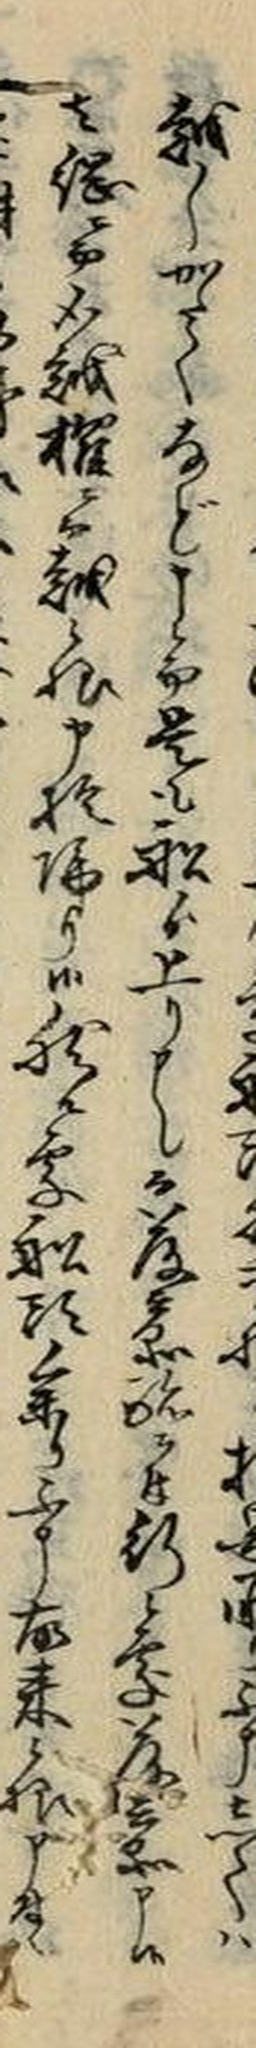は綱にて不越櫂にて越候様申捨帰り候然ル処船頭参り不申故来候様申付候
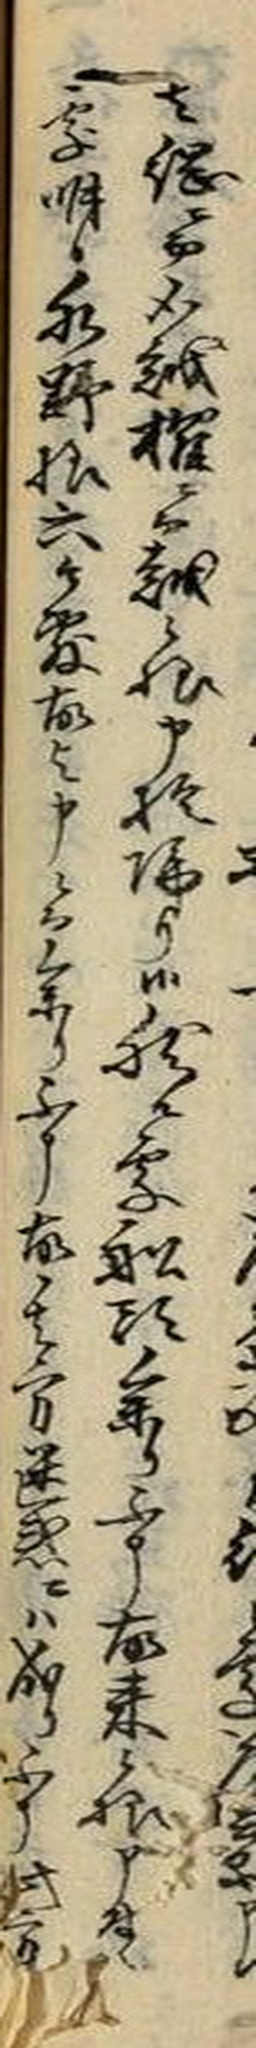処明日水野様六ケ敷故と申候て参り不申故其方迷惑には成り不申此方
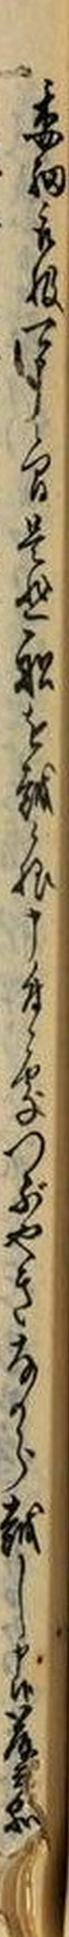委細取扱可申候間是非船を越候様申付候処つぶやきなから越し申候藤兵衛
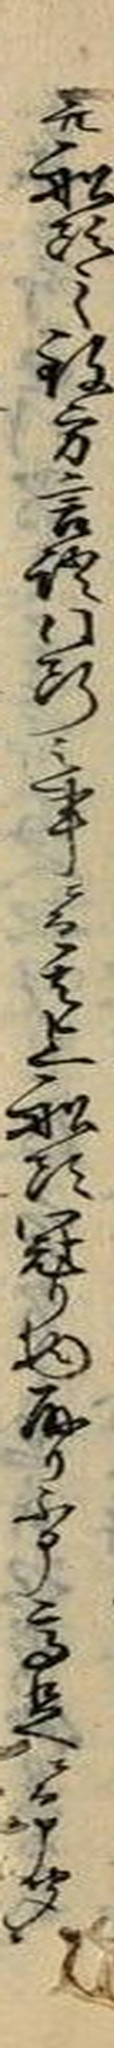并船頭之致方言語同断之事にて其上船頭冠り物取り不申高足にて申聞
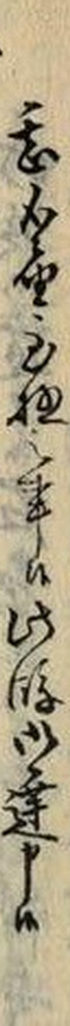甚不届至極之事候此段御達申候
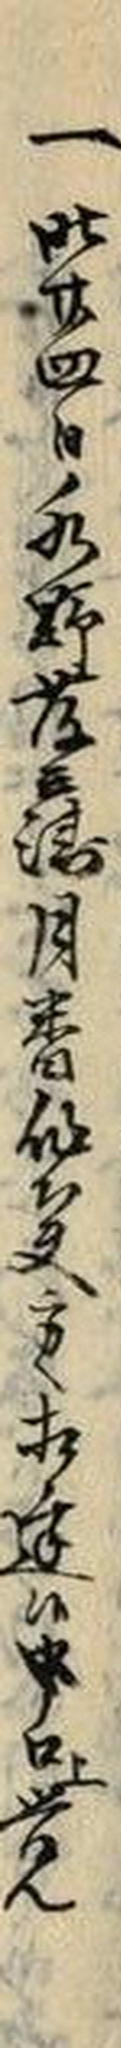一此廿四日水野藤兵衛月番作大夫方へ相達候口上覚
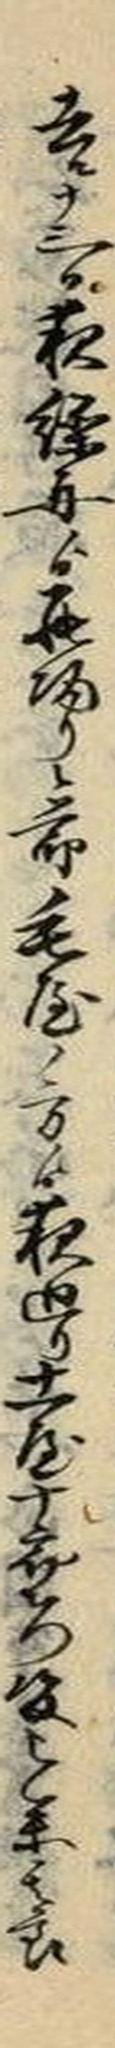去ル十三日夜繰舟ゟ罷帰り候節毛屋ノ方ゟ夜廻り土屋十郎右衛門殿被参其節
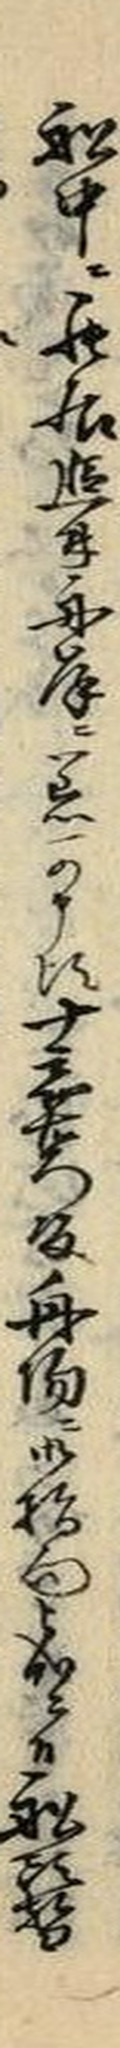船中に罷居追付舟岸に着可申頃十郎右衛門殿舟場に御指向被成に付船頭暫
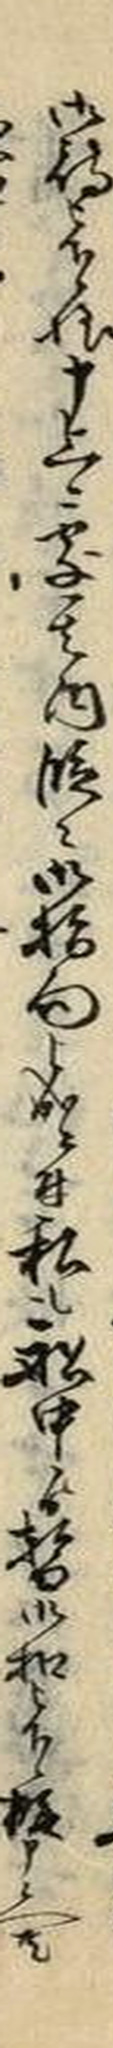御待被下候様申上候処其内段々御指向被成に付私も船中ゟ暫御控被下候様申候へ共
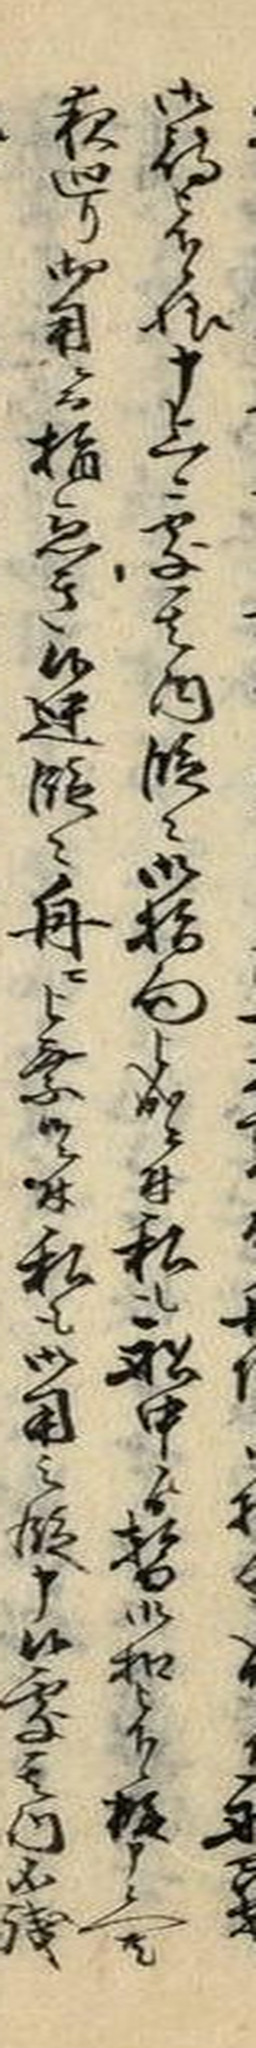夜廻り御用にて指急き候迚段々舟に被乗候に付私も御用之段申候処其内不残
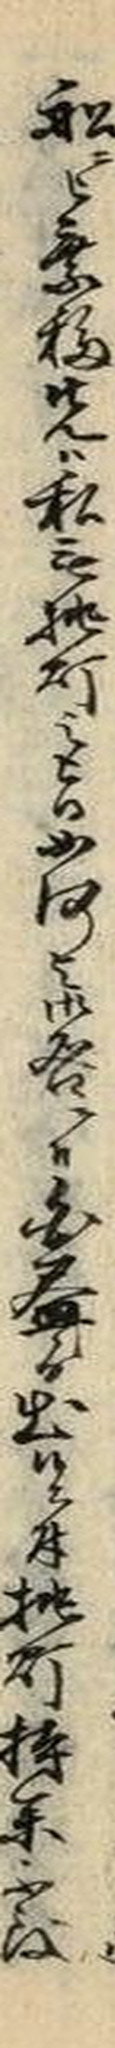船に被乗移先は私無挑灯之旨如何と御咎に付白昼ゟ出候に付挑灯持参不致
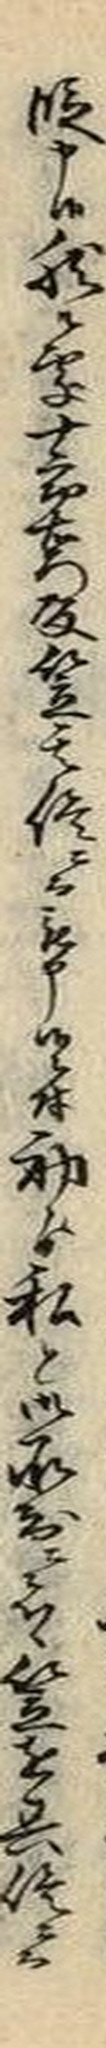段申候然ル処十郎右衛門殿笠其儘にて被申候に付初ゟ私と御承知に候はゝ笠を其儘にて
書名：御城下諸事之部
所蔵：福井県文書館 Fukui Prefectural Archives
